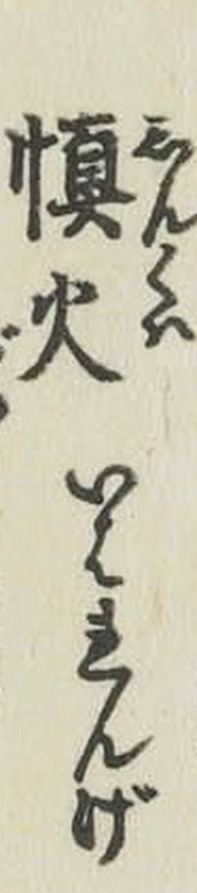慎火いはれんげ
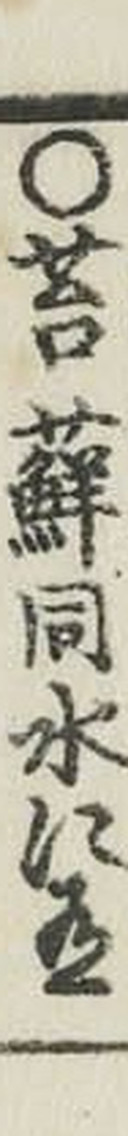○苔蘚同水に有
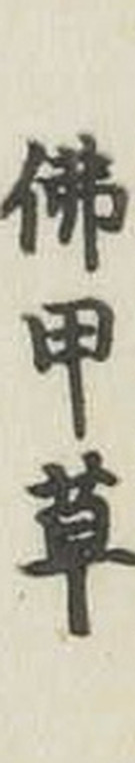仏甲草
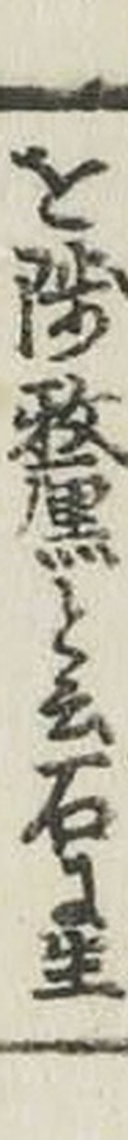を陟釐と云石に生
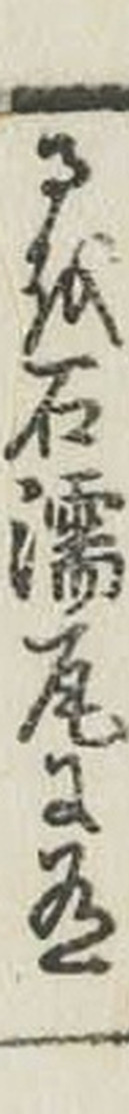るを石濡瓦に有
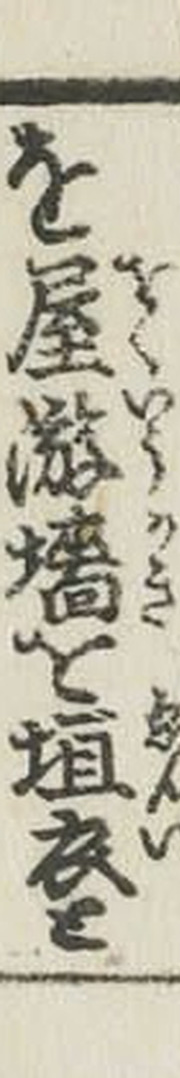を屋游墻を垣衣と云
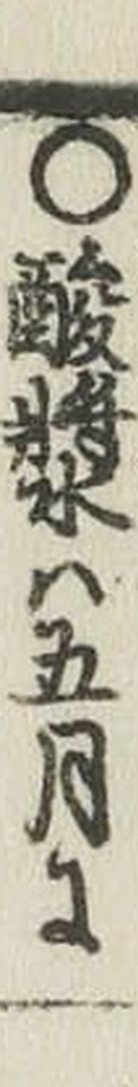○酸漿は五月に
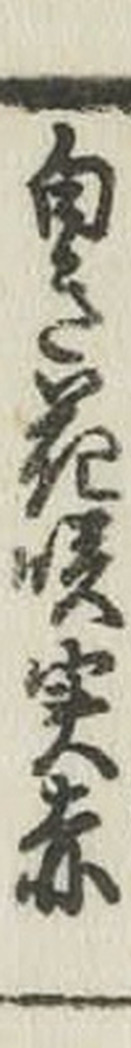白き花咲実赤
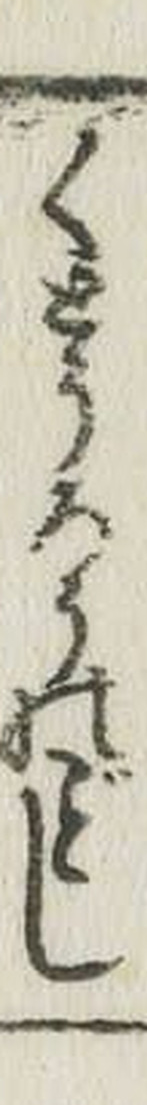くとうろうのごとし
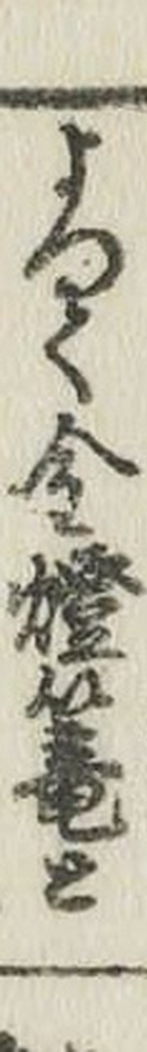よつて金灯篭と云
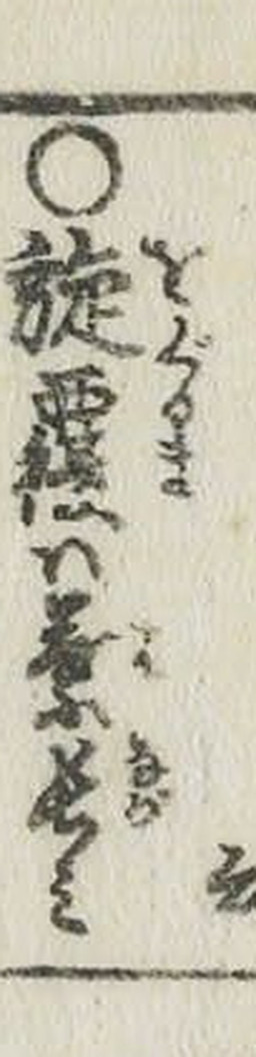○旋覆は葉長み
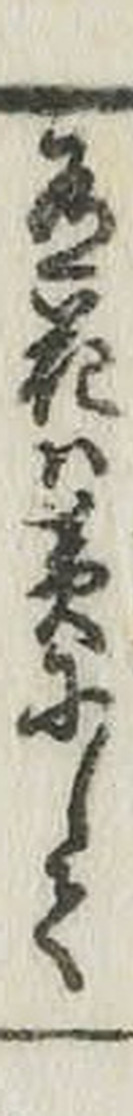有花は黄にして
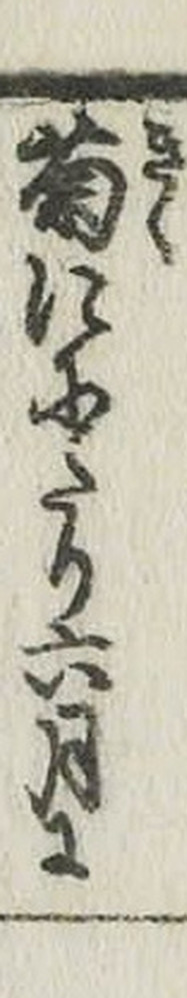菊ににたり六月に
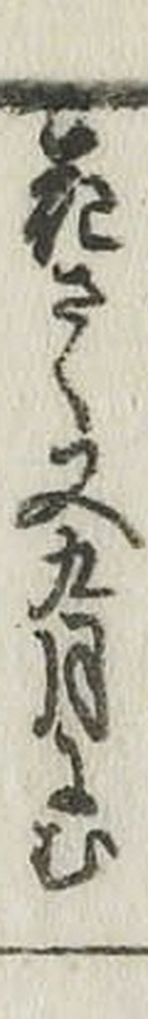花さく又九月にむ
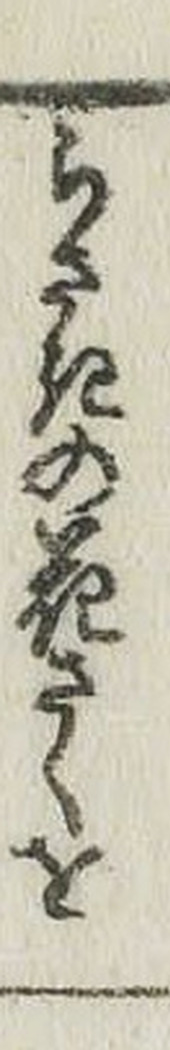らさきの花さくを
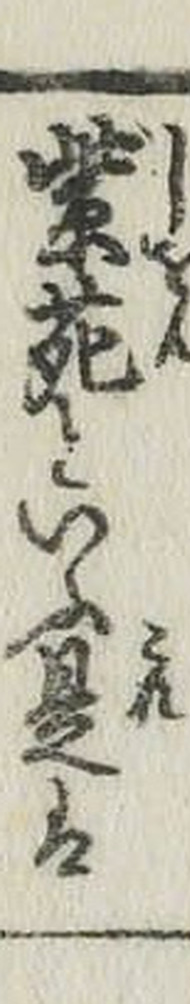紫苑といふ是は
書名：増補頭書訓蒙図彙大成 10巻 9:巻之20
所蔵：東京学芸大学教育コンテンツアーカイブ
